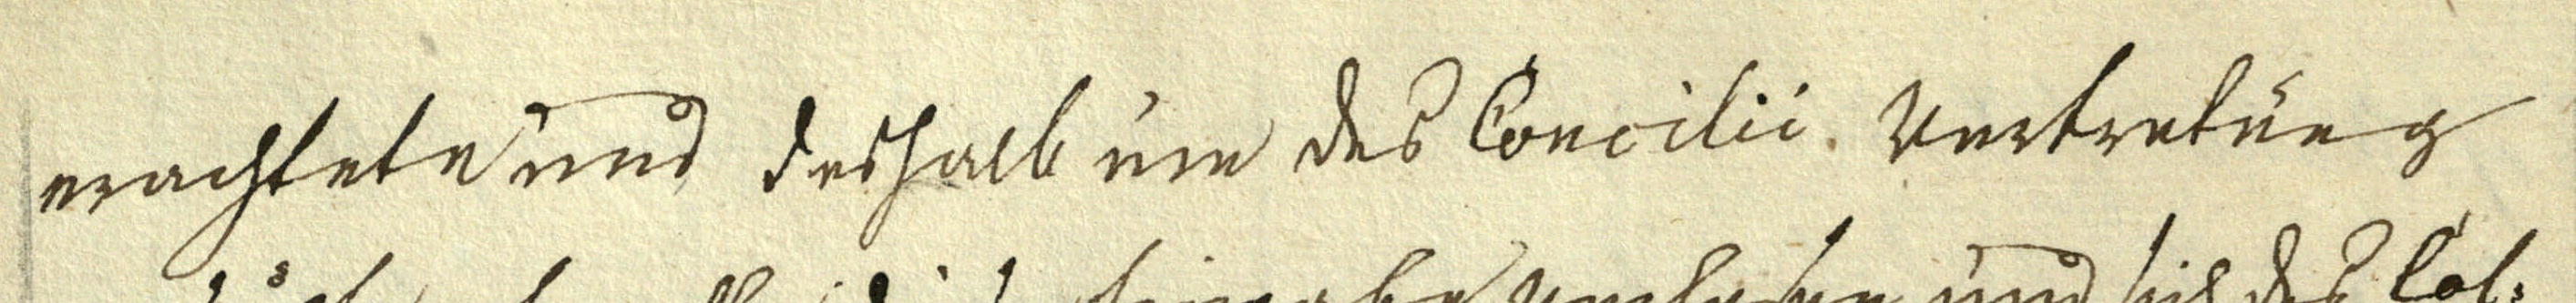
erachtete und deshalb um des Concilii Vertretung
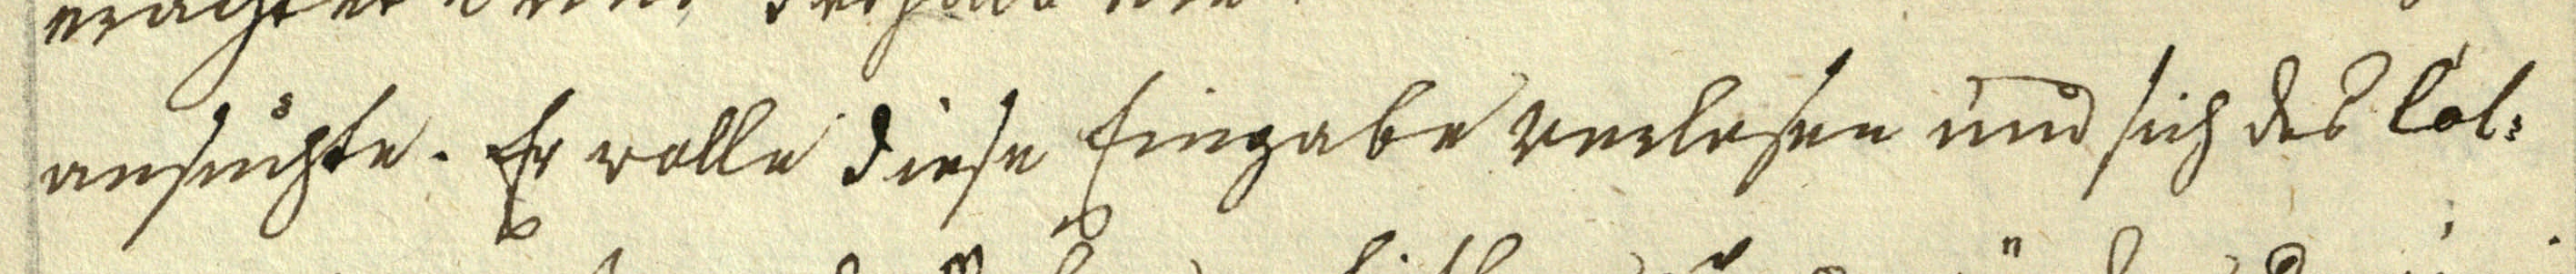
ansuchte. Er wolle diese Eingabe verlesen und sich des Col¬
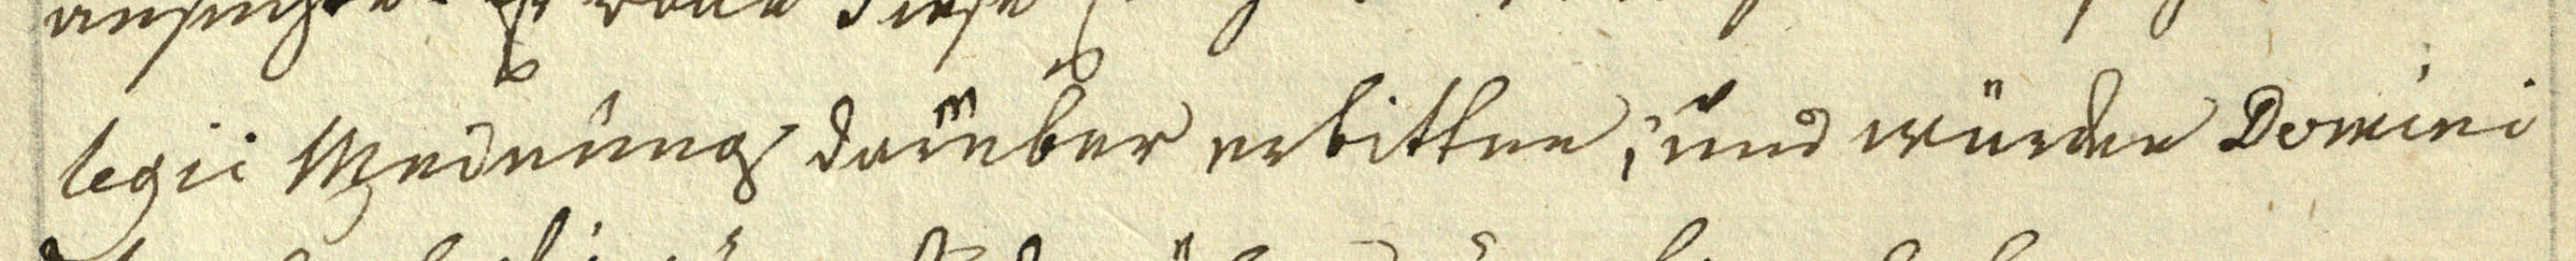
legii Meinung darüber erbitten, und würden Domini
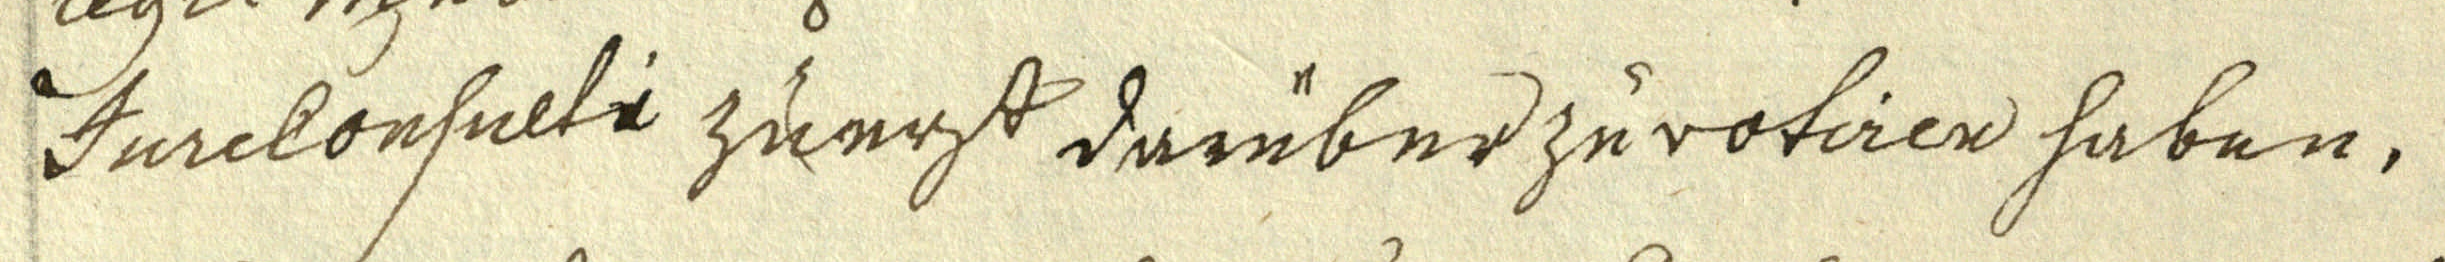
Jureconsulti zuerst darüber zu votiren haben,
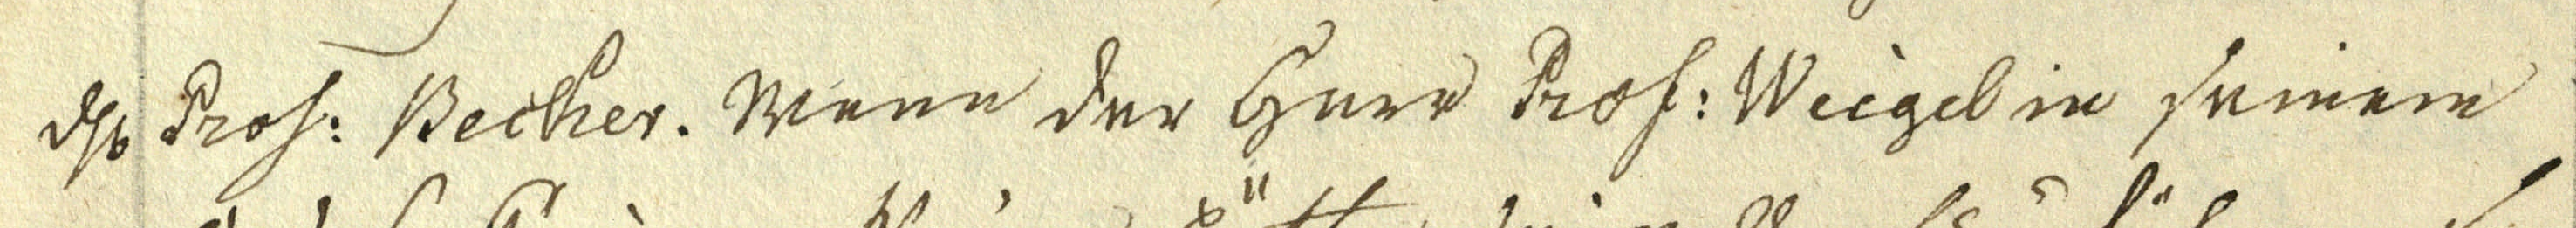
dh Prof Becker. Wenn der Herr Prof. Weigel in seinem
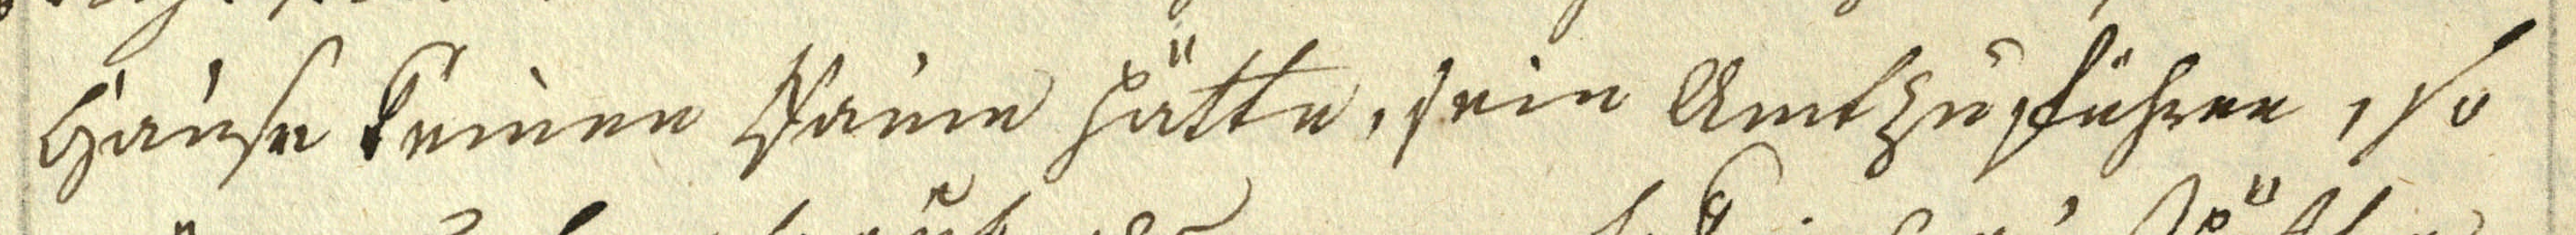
Hause keinen Raum hätte, sein Amt zuführen, so
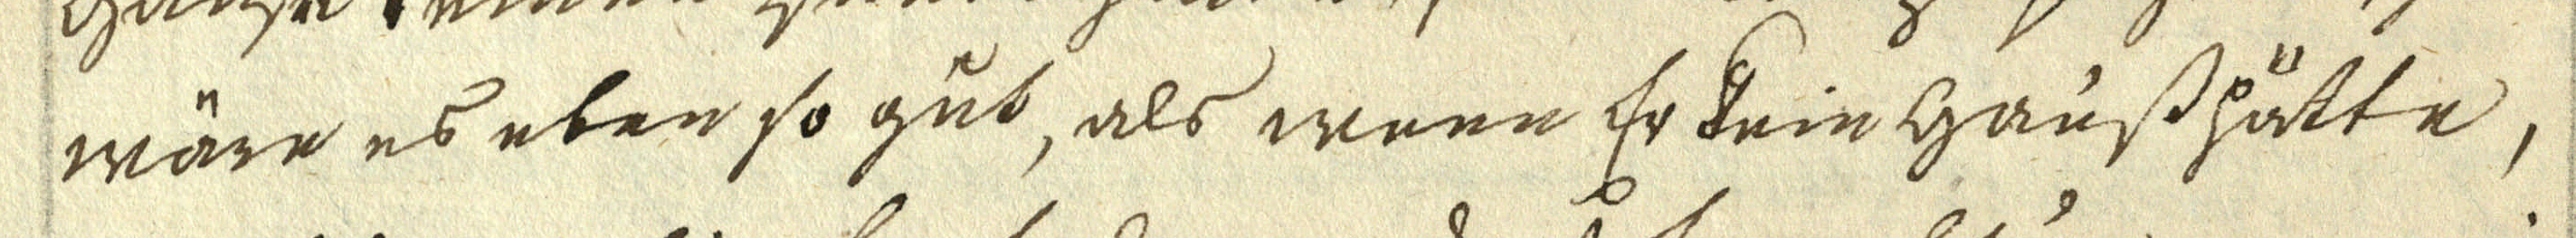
wäre es eben so gut, als wenn Er kein Hauß hätte,
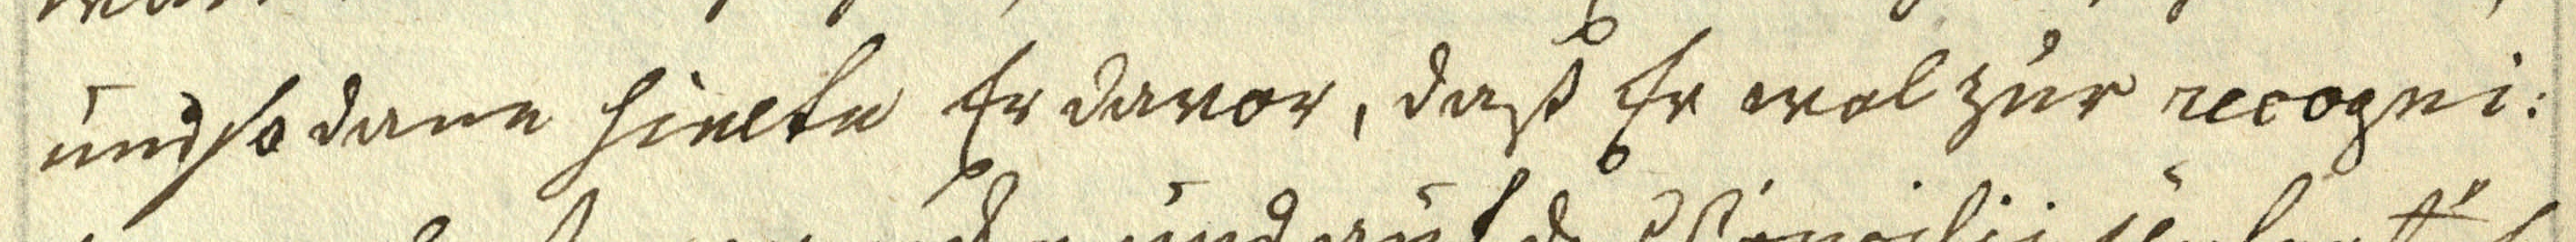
und so dann hielte Er davor, daß Er wol zur recogni¬
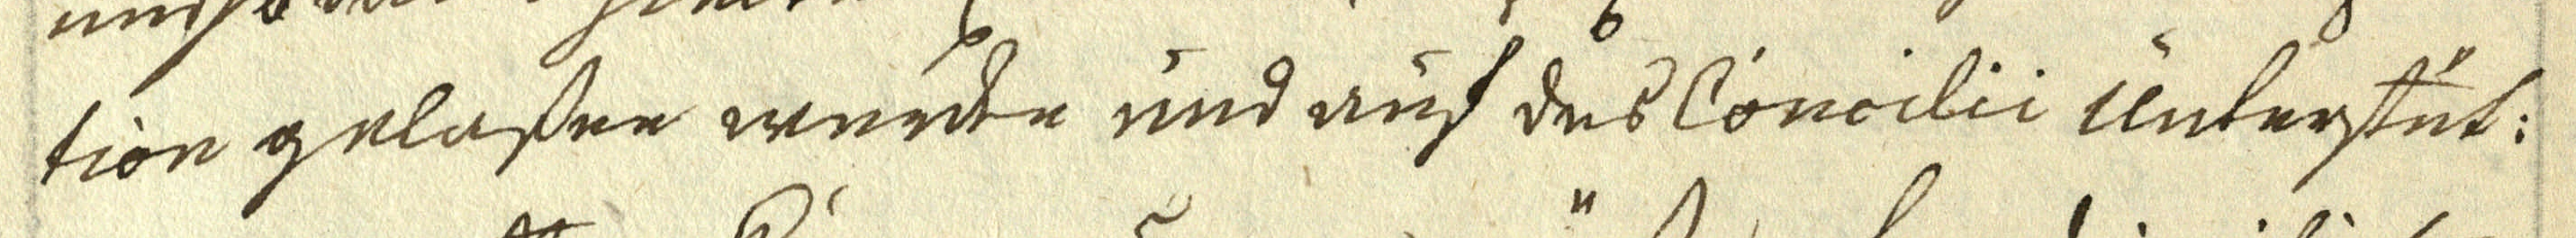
tion gelaßen werden und auf des Concilii Unterstüt¬
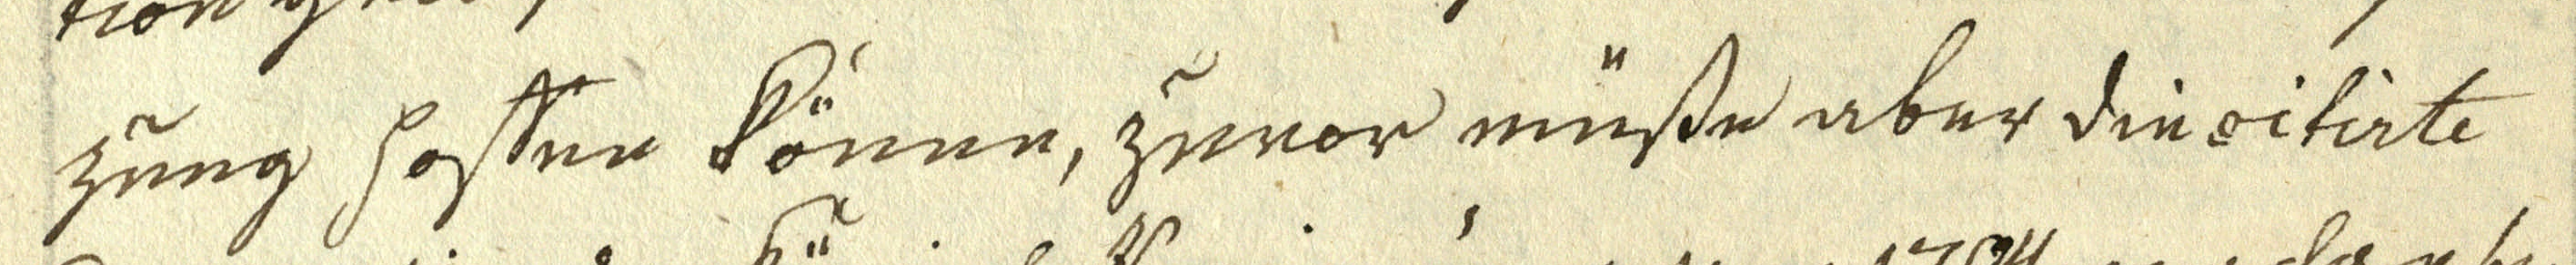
zung hoffen könne, zuvor müße aber die sitirte
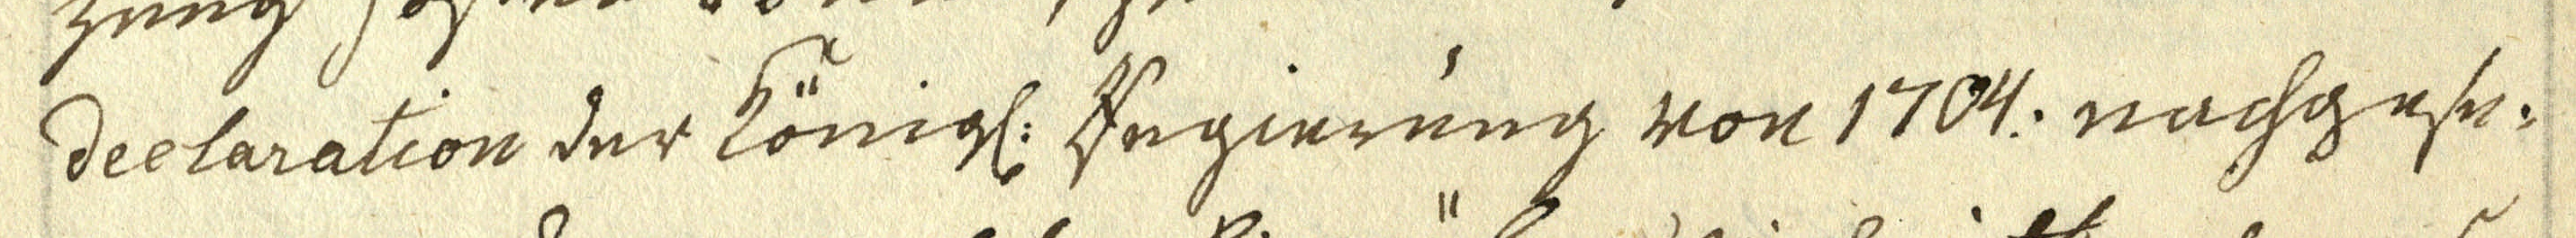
declaration der Königl. Regierung von 1704. nachgese¬
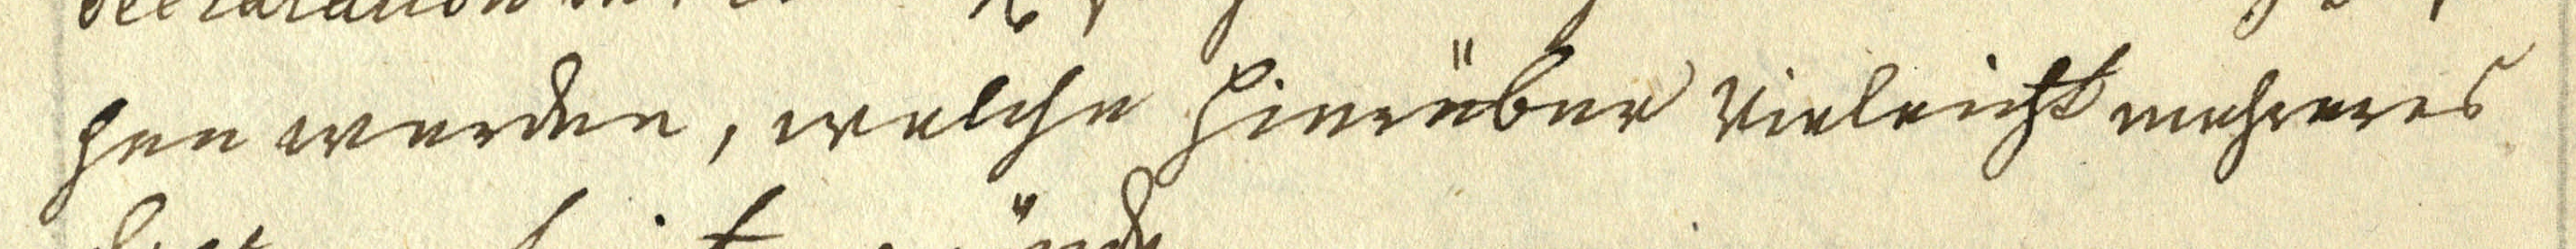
hen werden, welche hierüber vieleicht mehreres
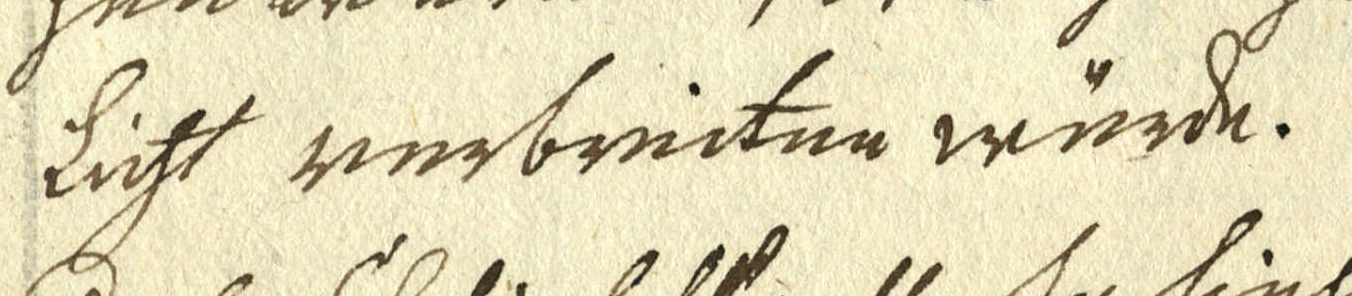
Licht verbreiten würde.
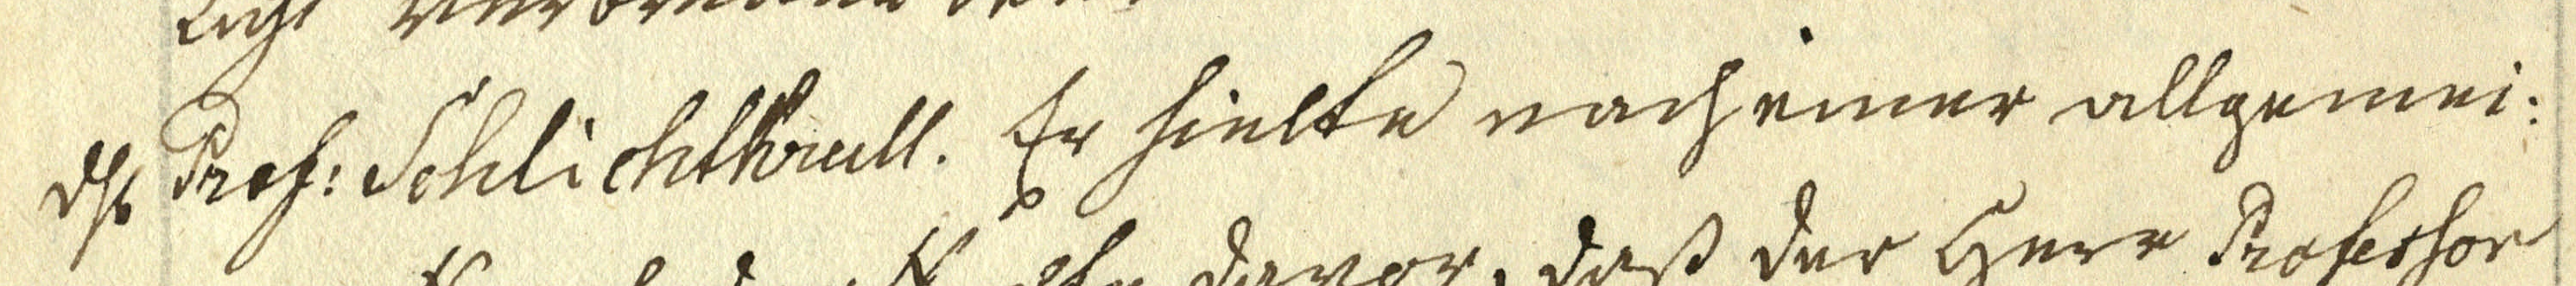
dh Prof. Schlichtkrull. Er hielte nach einer allgemei¬
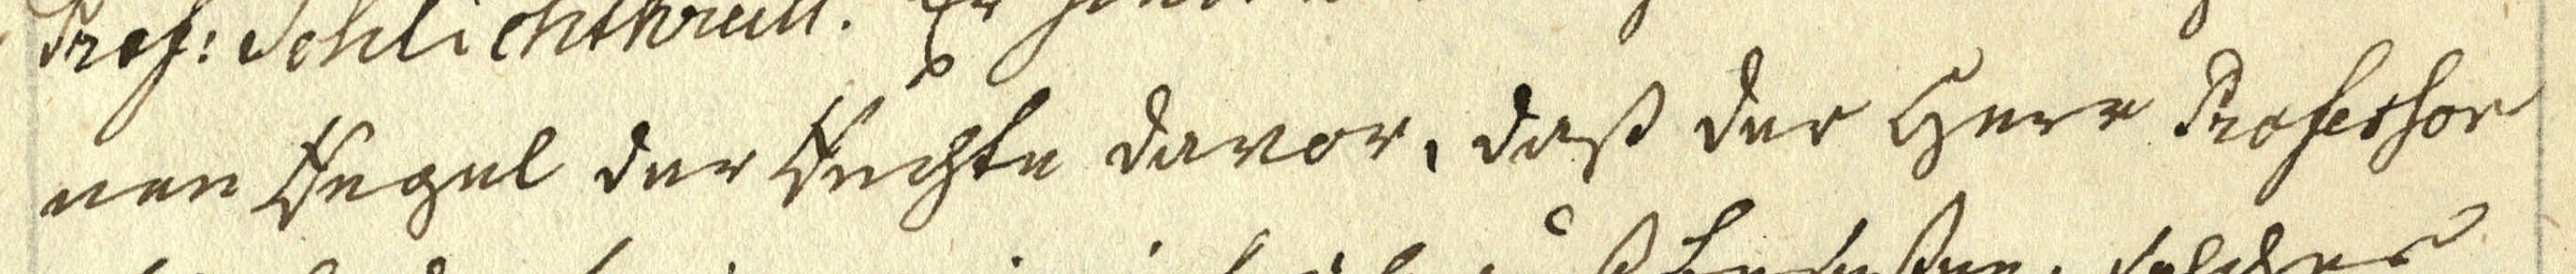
nen Regel der Rechte davor, daß der Herr Professor
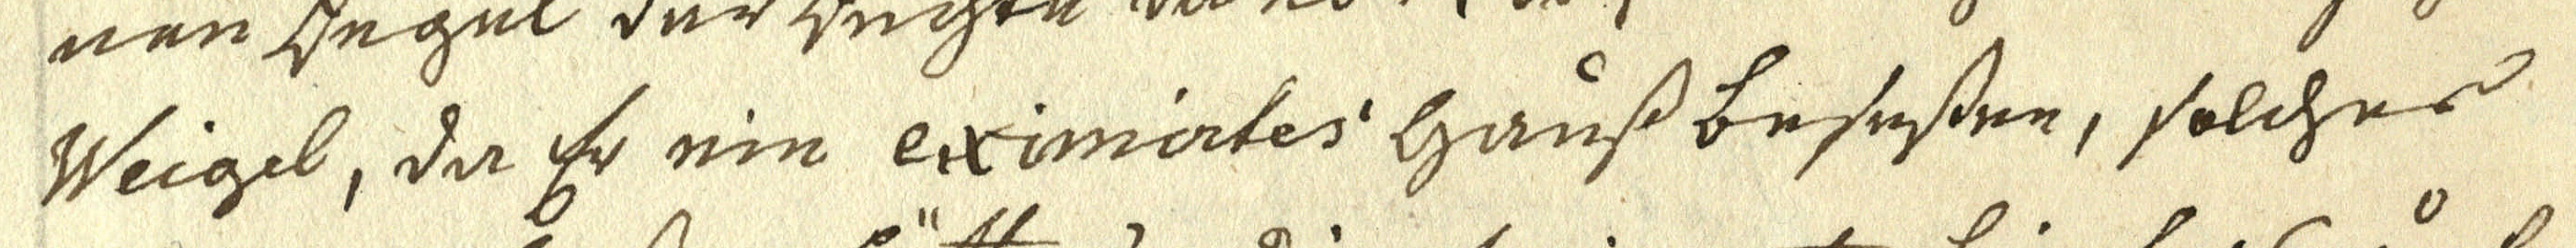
Weigel, da Er ein eximirtes Hauß beseßen, solches
